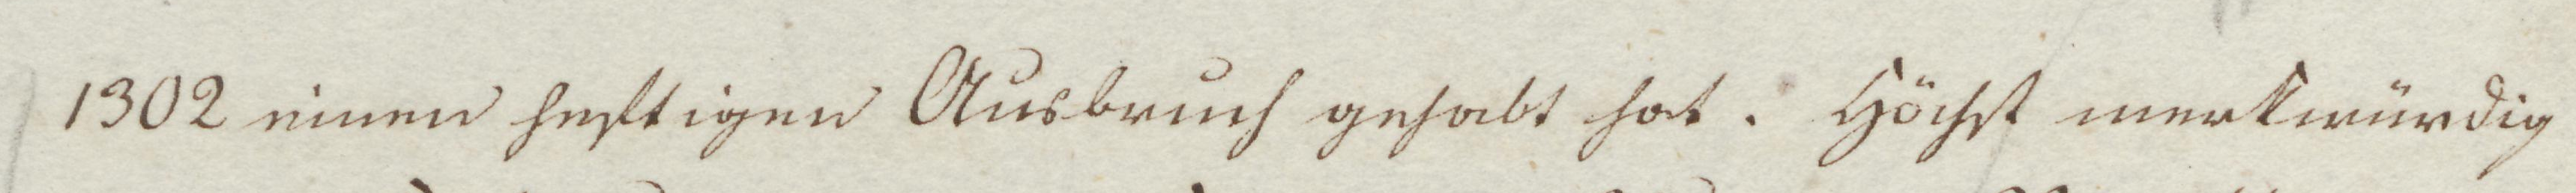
1302 einen heftigen Ausbruch gehabt hat. Höchst merkwürdig
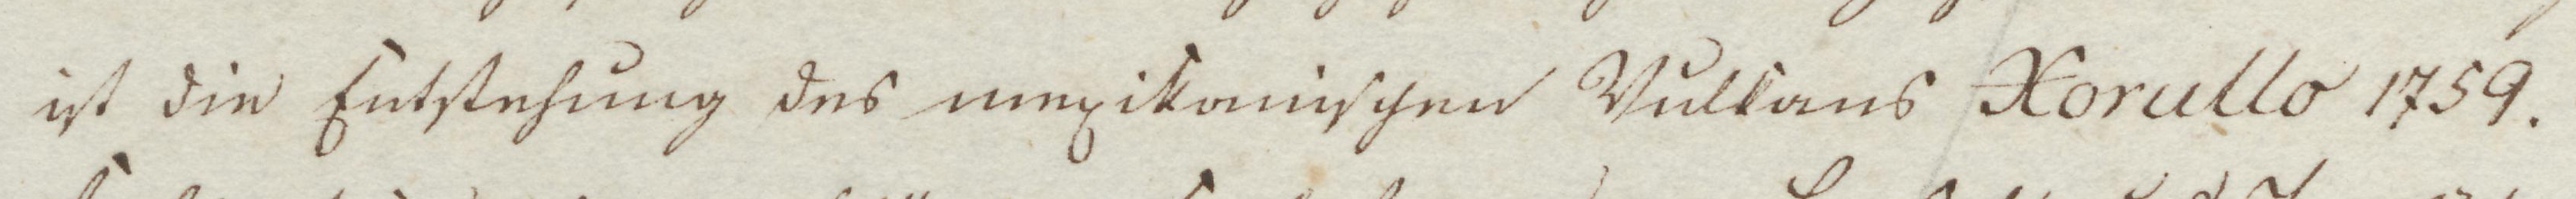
ist die Entstehung des mexikanischen Vulkans Xorullo 1759.
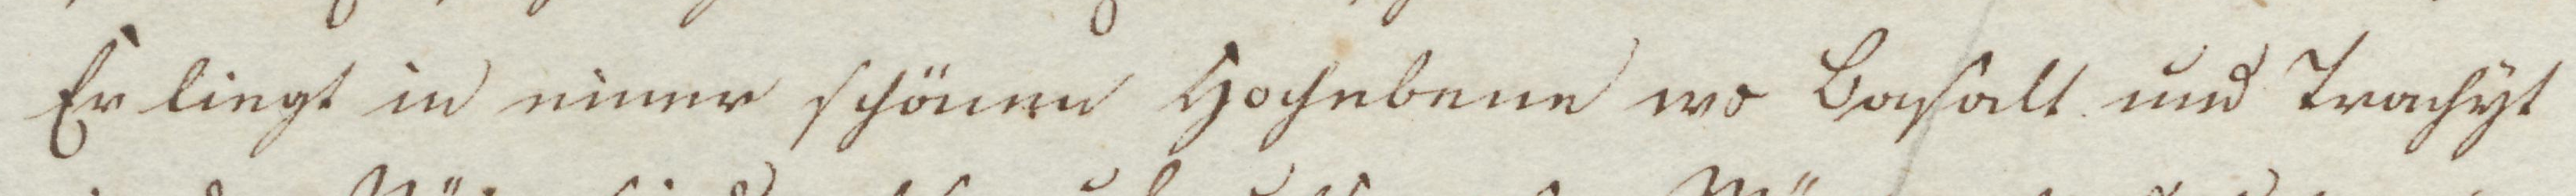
Er liegt in einer schönen Hochebene wo Basalt und Trachÿt
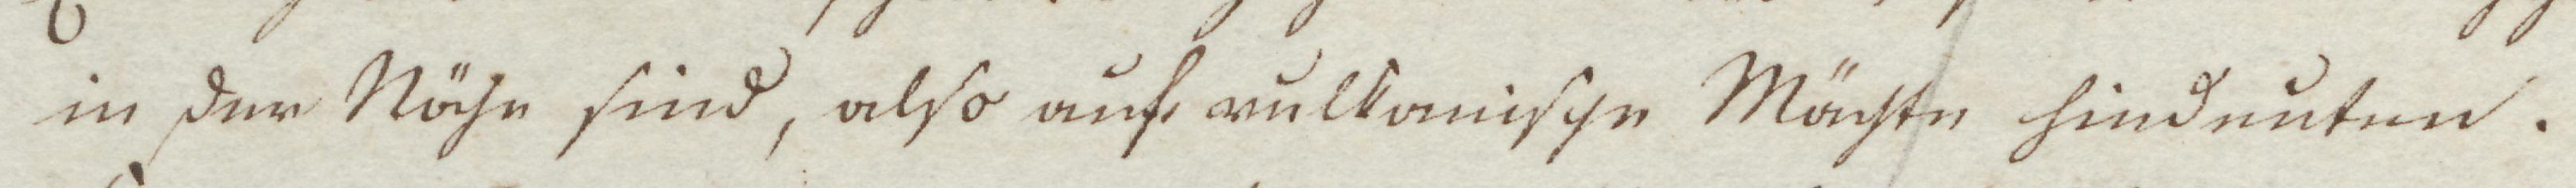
in der Nähe sind, also auf vulkanische Mächte hindeuten.
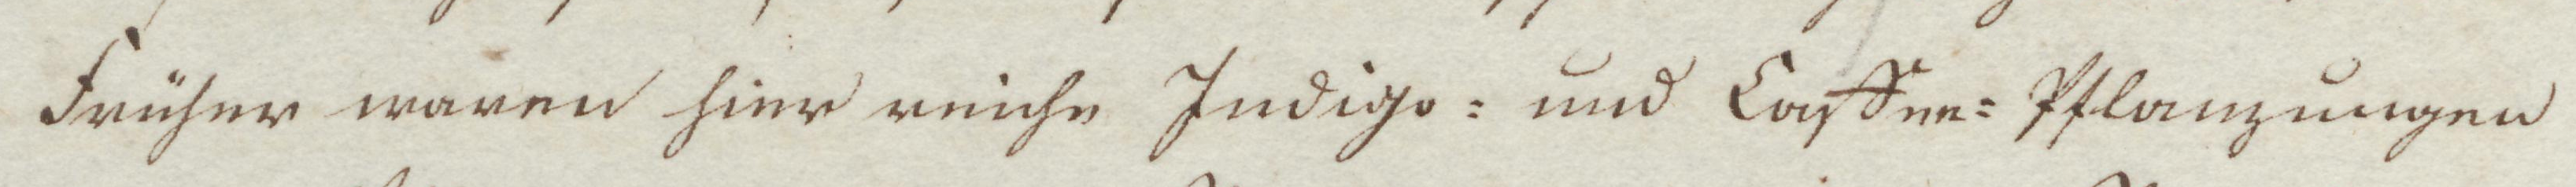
Früher waren hier reiche Indigo- und Caffee-Pflanzungen
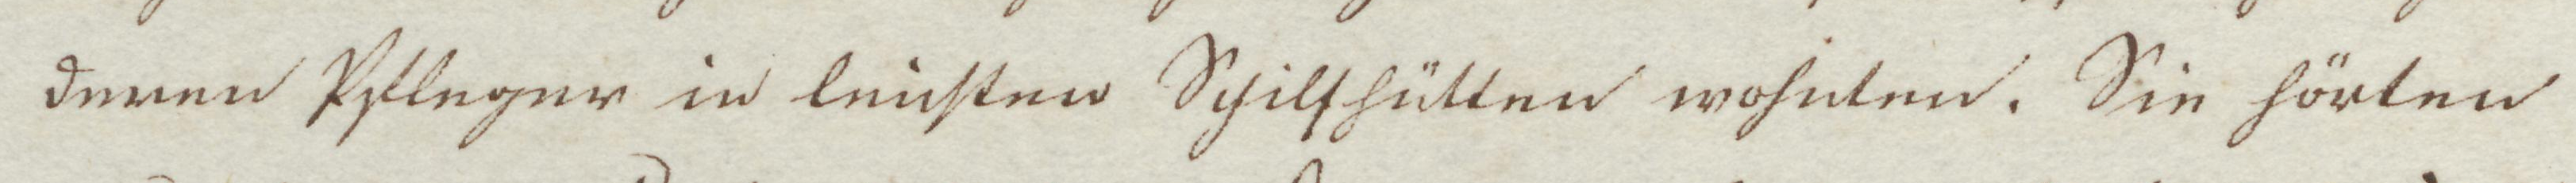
deren Pfleger in leichten Schilfhütten wohnten. Sie hörten
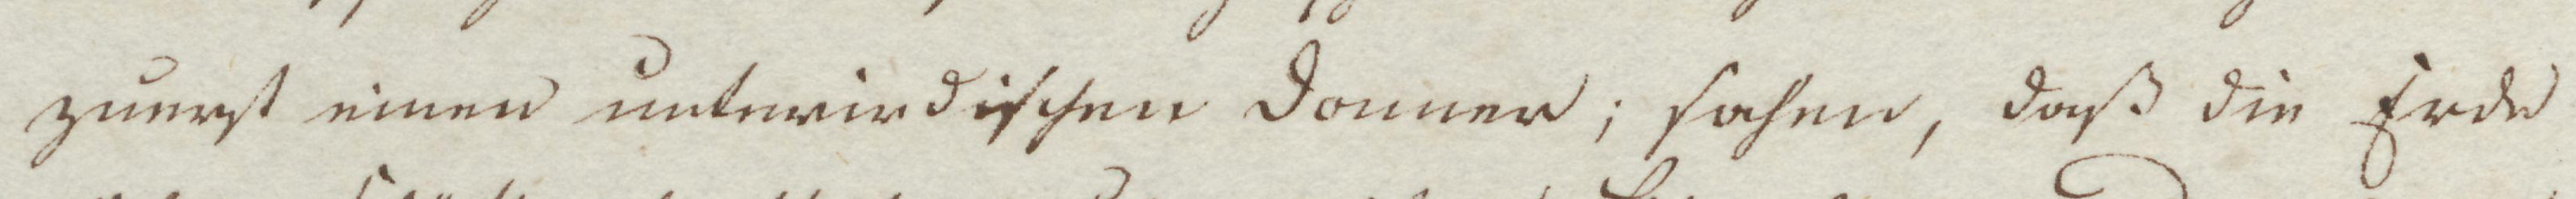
zuerst einen unterirdischen Donner; sahen, daß die Erde
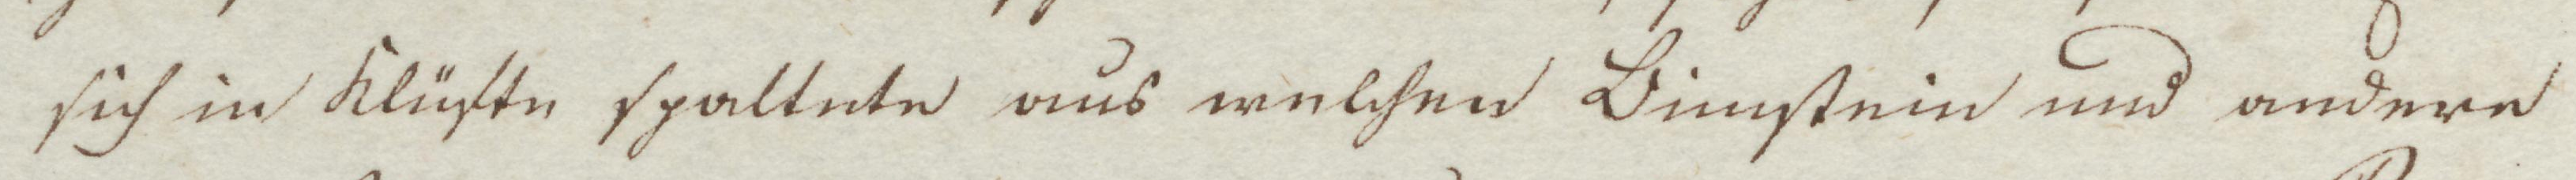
sich in Klüfte spaltete aus welchen Bimstein und andere
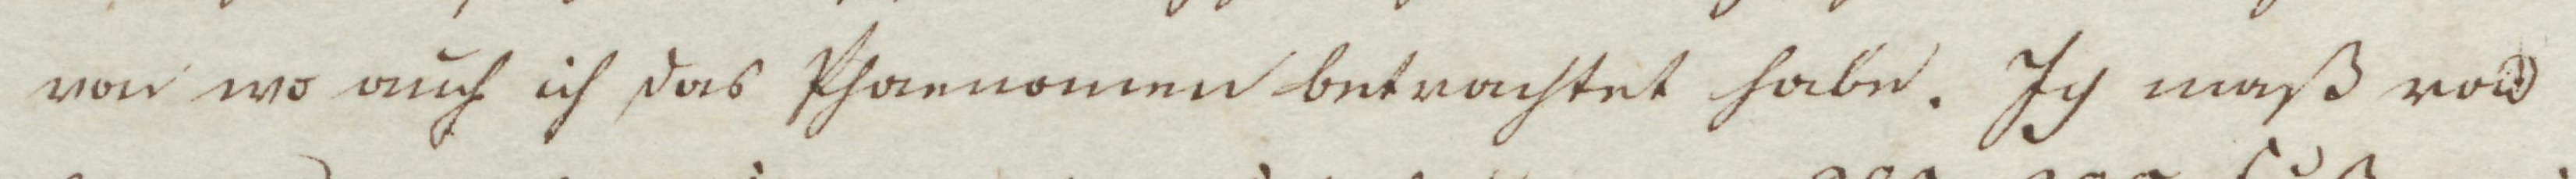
von wo auch ich das Phaenomen betrachtet habe. Ich maß von
